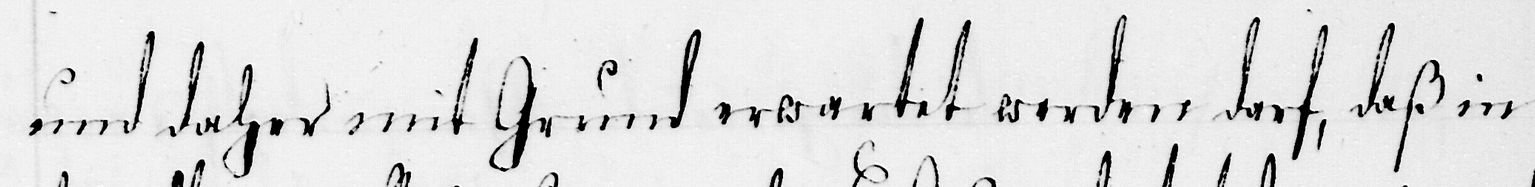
und daher mit Grund erwartet werden darf, daß in
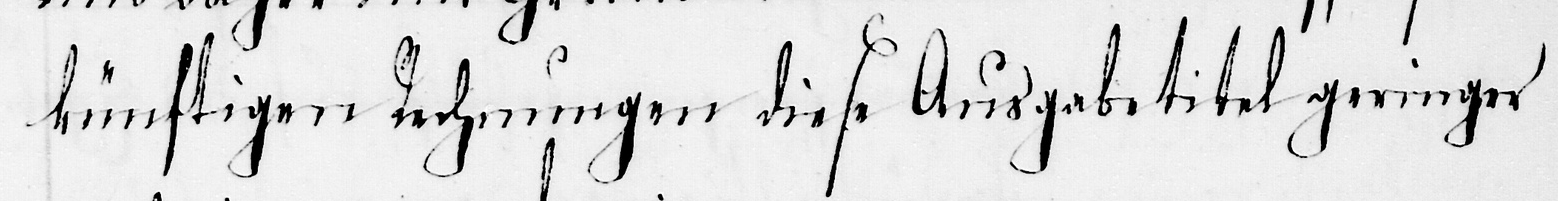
künftigen Rechnungen diese Ausgabetitel geringer
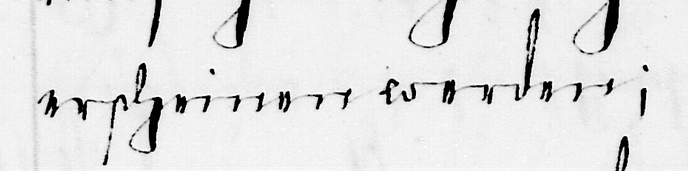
erscheinen werden;
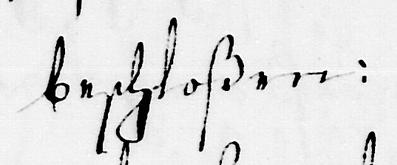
beschloßen:
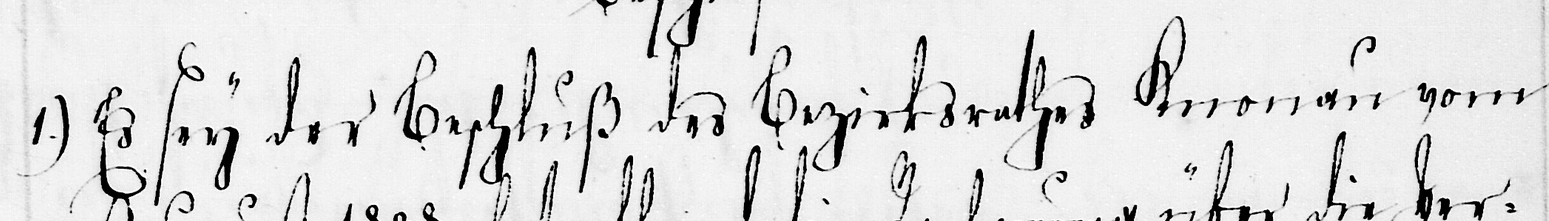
1.) Es sey der Beschluß des Bezirksrathes Knonau vom
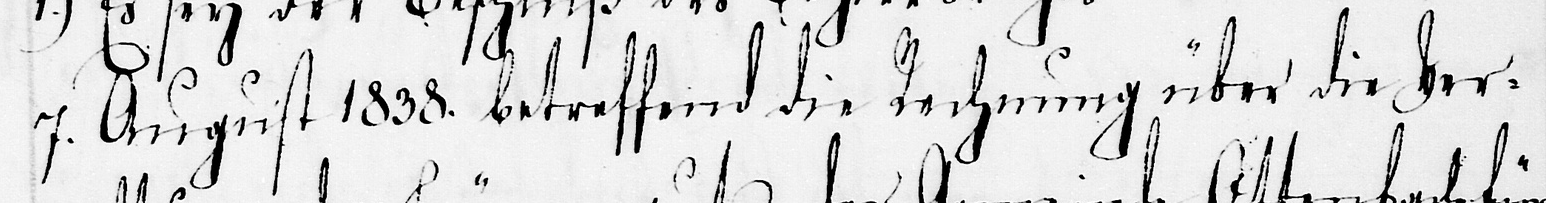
7. August 1838. betreffend die Rechnung über die Ver¬
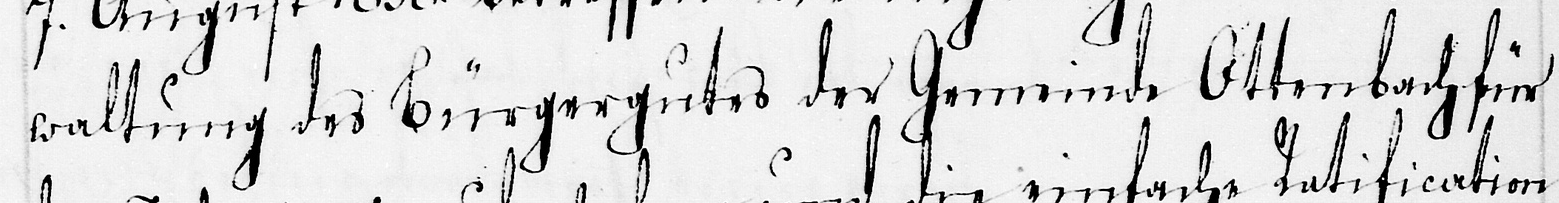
waltung des Bürgergutes der Gemeinde Ottenbach für
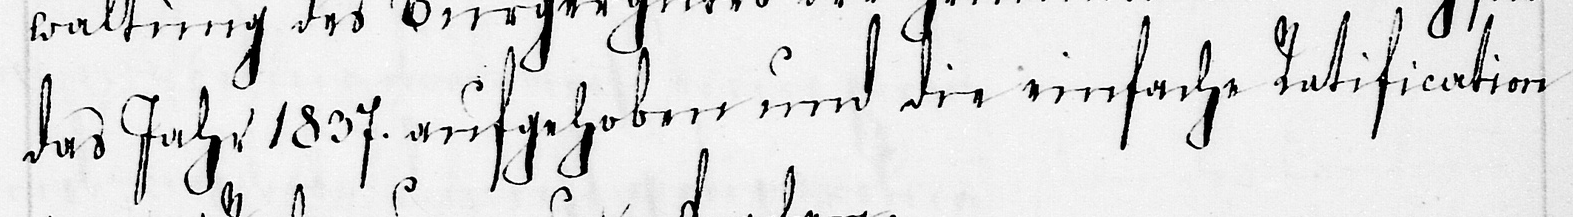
das Jahr 1837. aufgehoben und die einfache Ratification
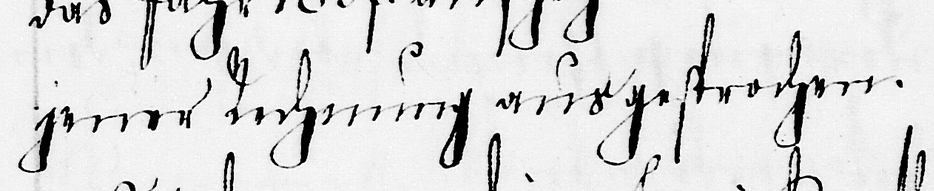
jener Rechnung ausgesprochen.
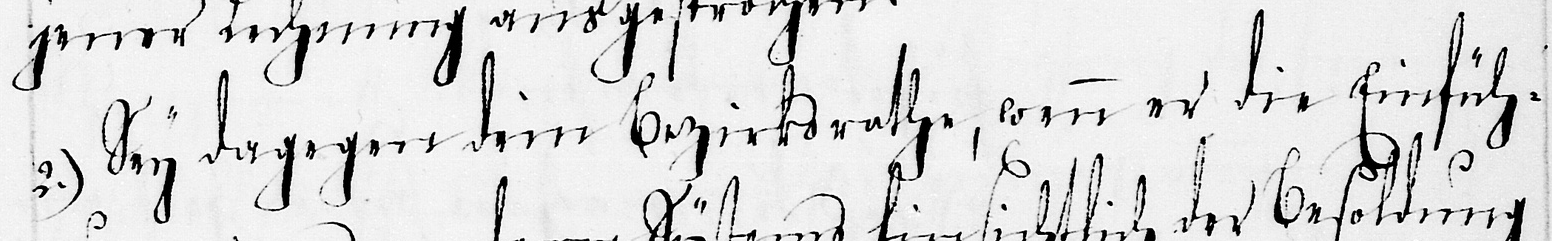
2.) Sey dagegen dem Bezirksrathe, wenn er die Einfüh¬
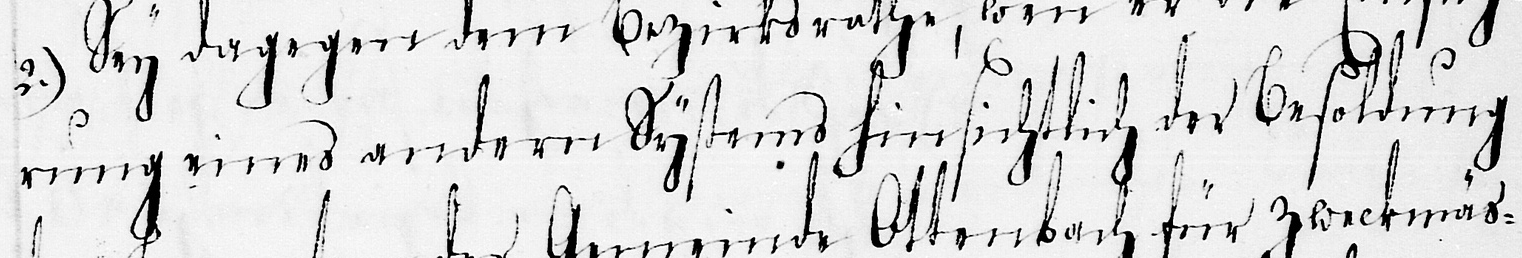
rung eines andern Systems hinsichtlich der Besoldung
